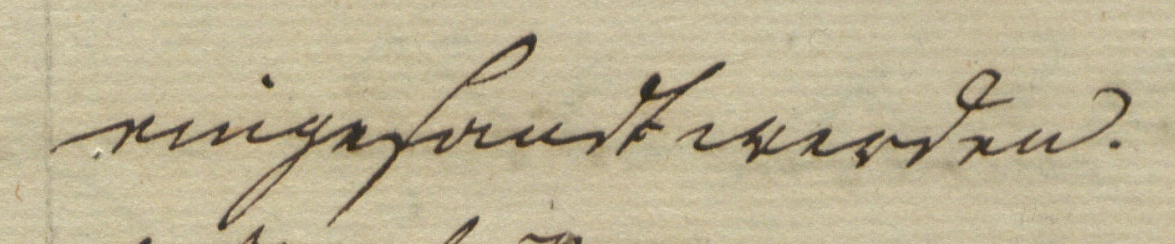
eingesandt werden.
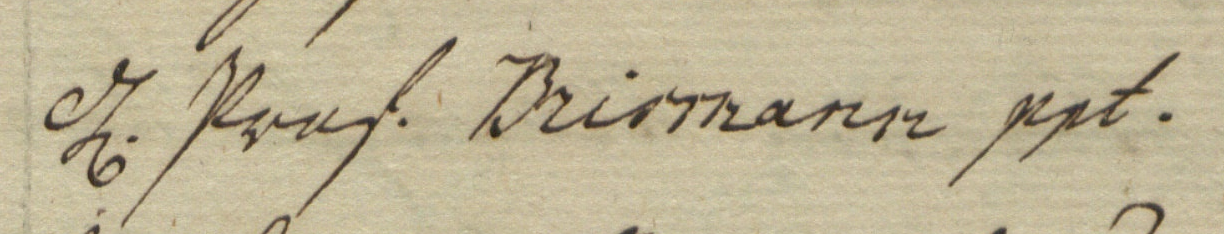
dh. Prof. Brismann ppt.
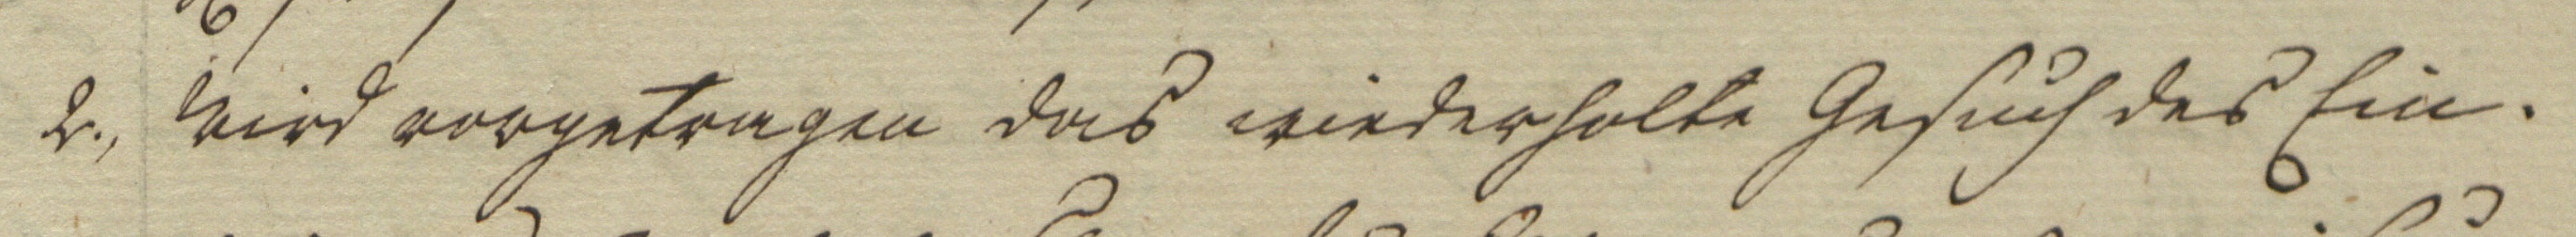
2., Wird vorgetragen das wiederholte Gesuch des Ein¬
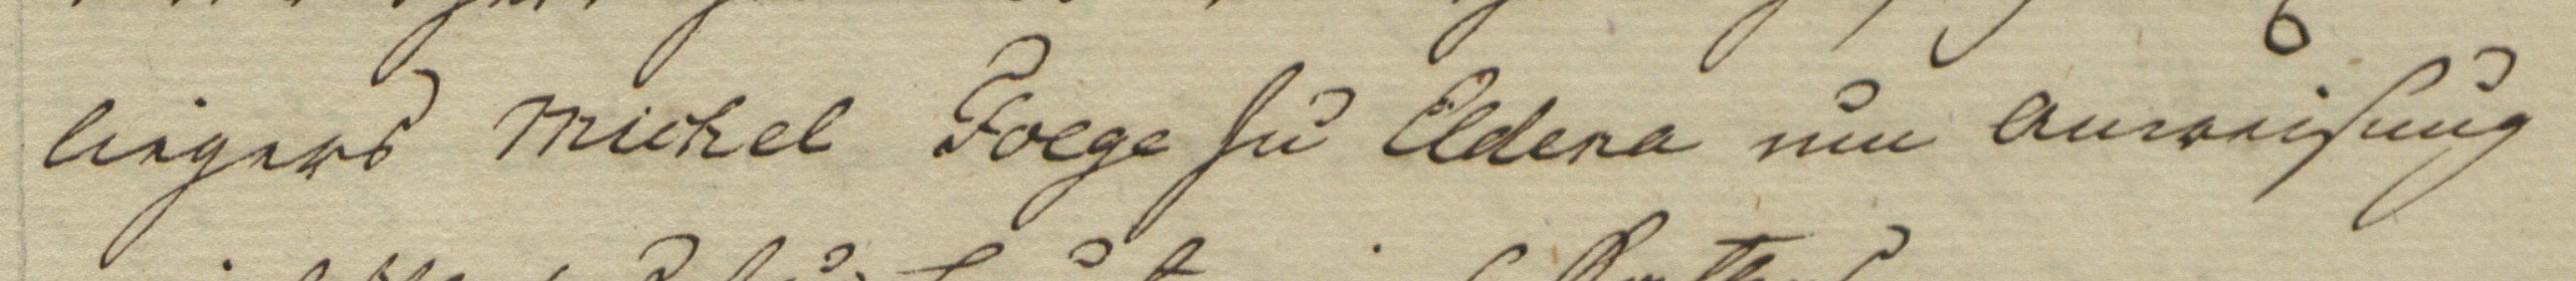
liegers Michel Foege zu Eldena um Anweisung
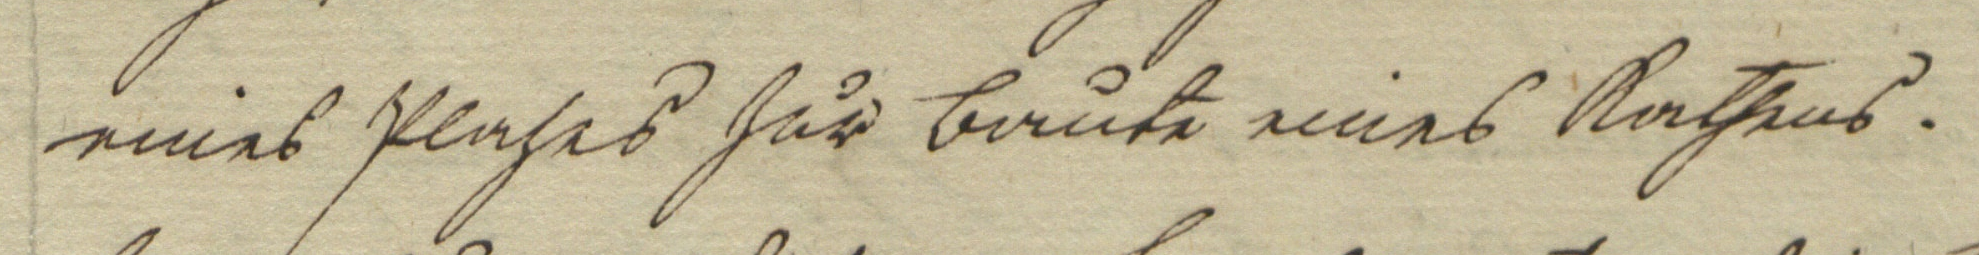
eines Platzes zur Baute eines Kathens.
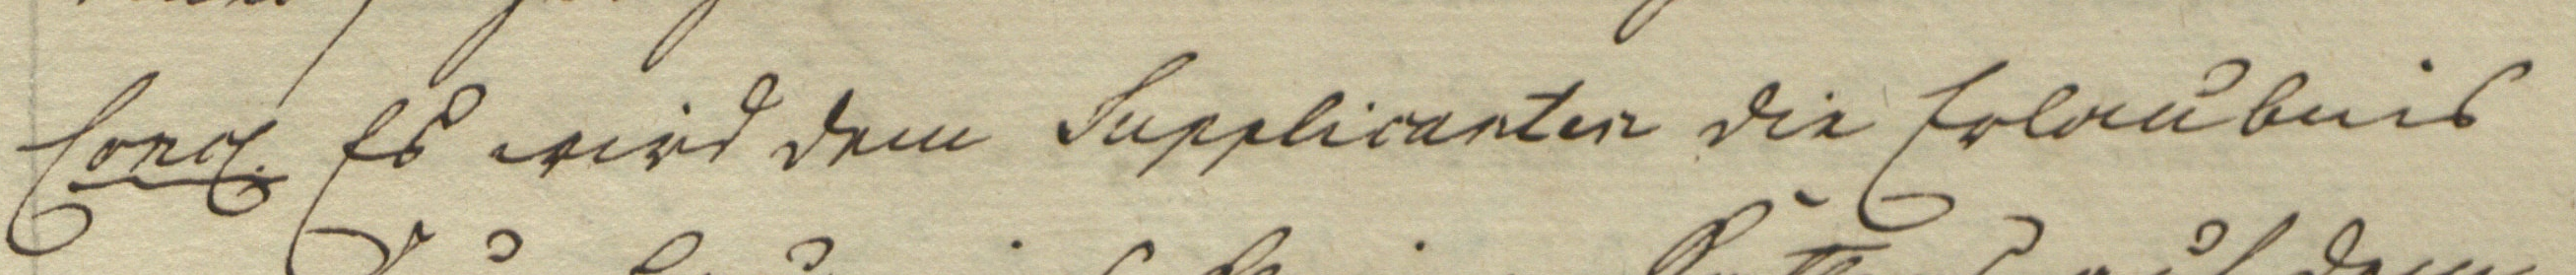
Concl. Es wird dem Supplicanten die Erlaubnis
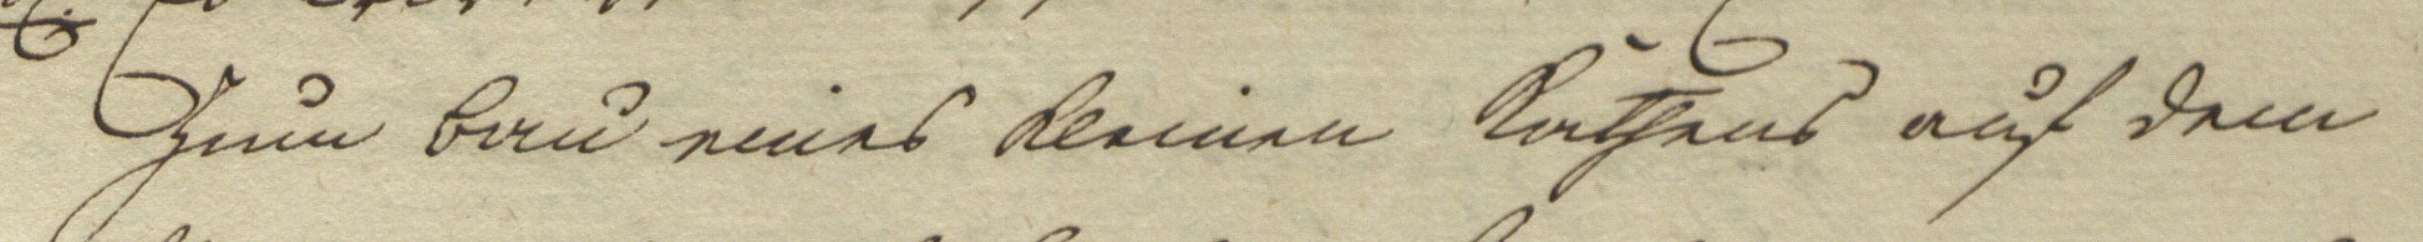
zum Bau eines kleinen Kathens auf dem
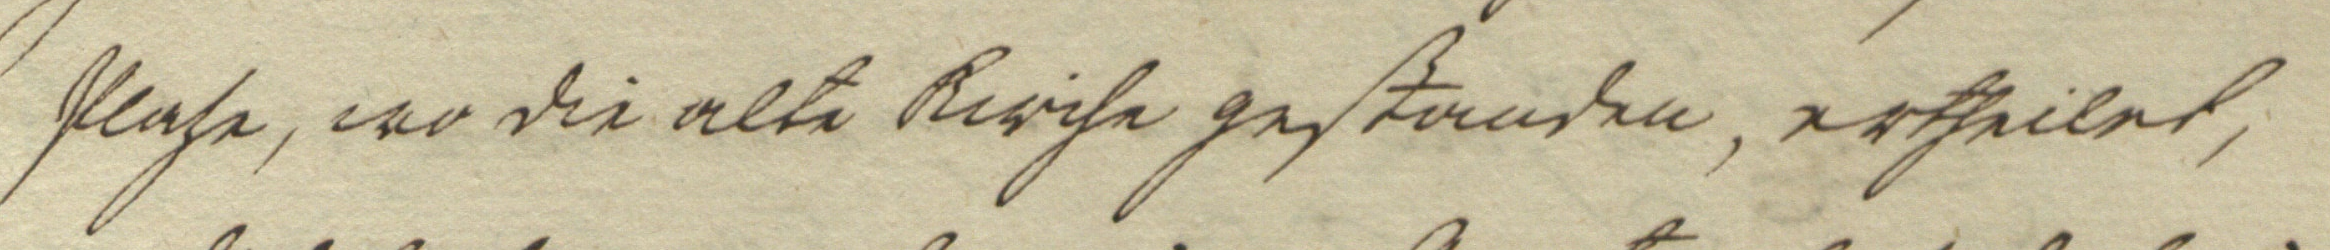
Plaze, wo die alte Kirche gestanden, ertheilet,
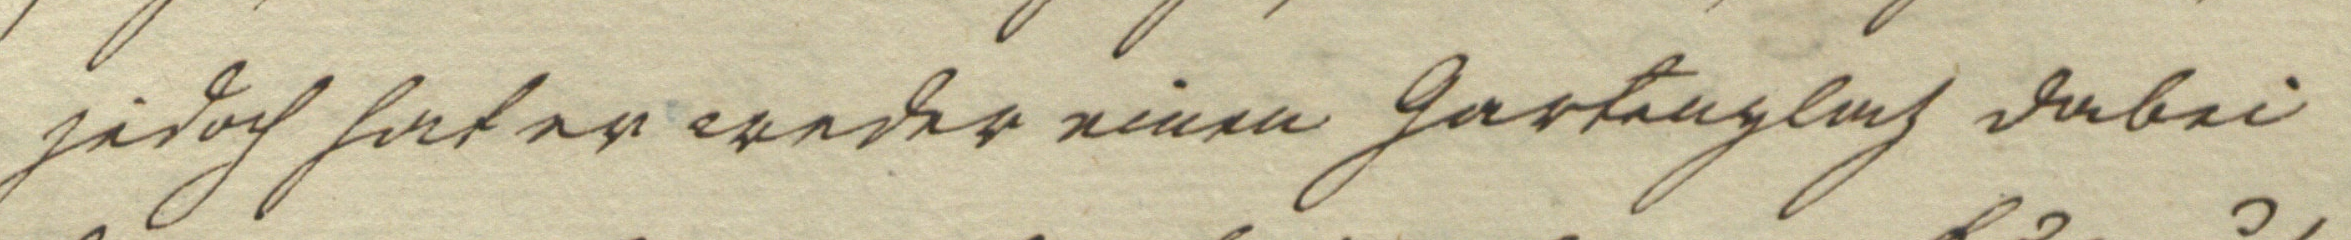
jedoch hat er weder einen Gartenplaz dabei
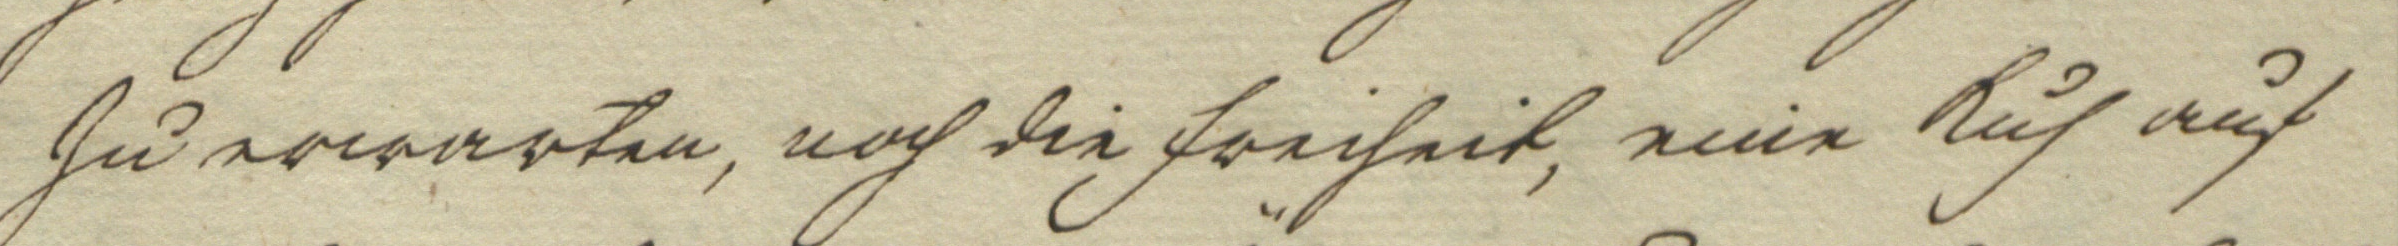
zu erwarten, noch die Freiheit, eine Kuh auf
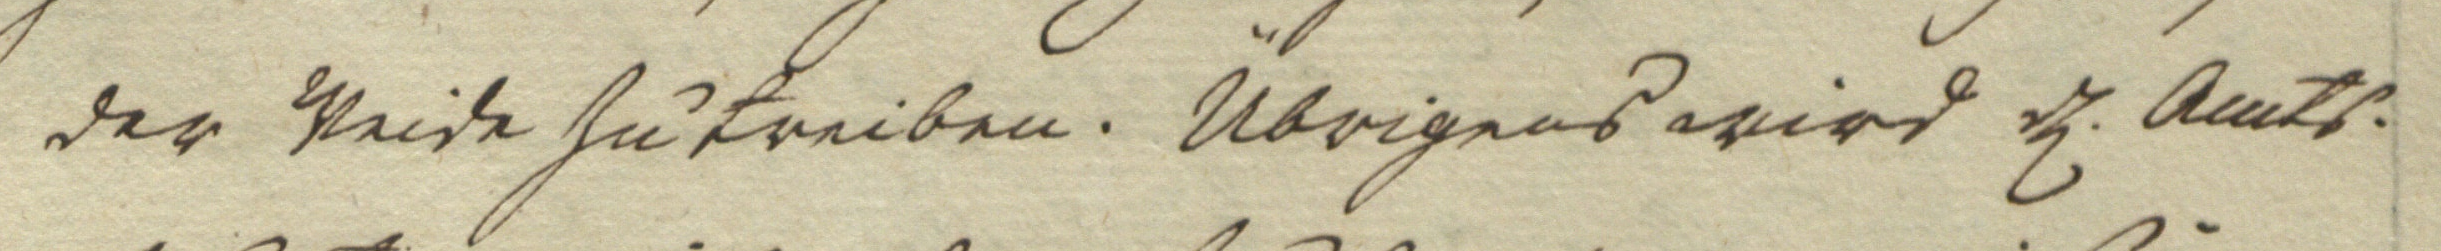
der Weide zutreiben. Übrigens wird dh. Amts¬
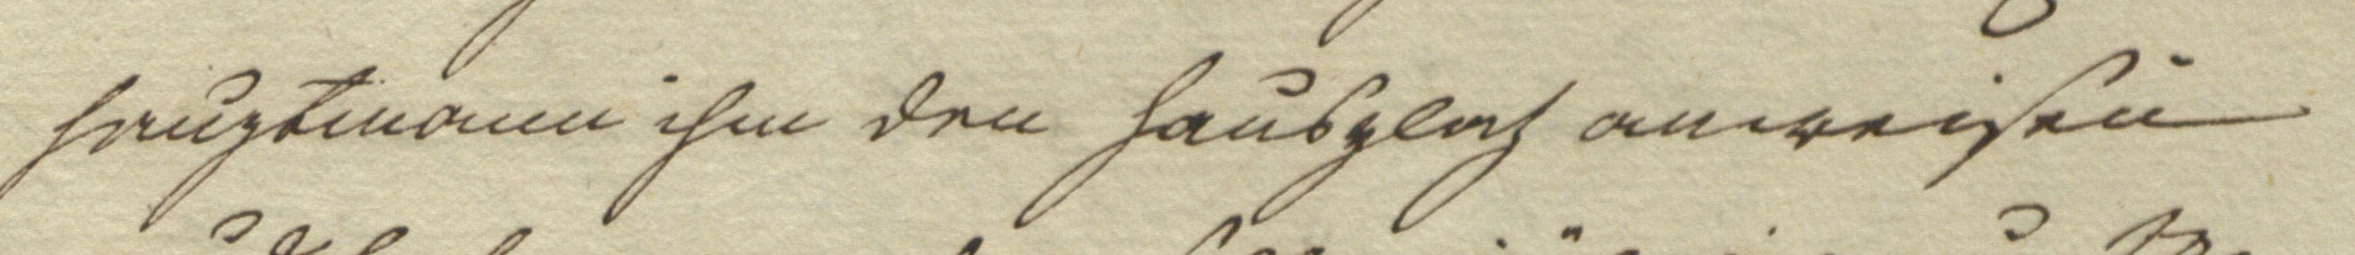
hauptmann ihm den Hausplaz anweisen
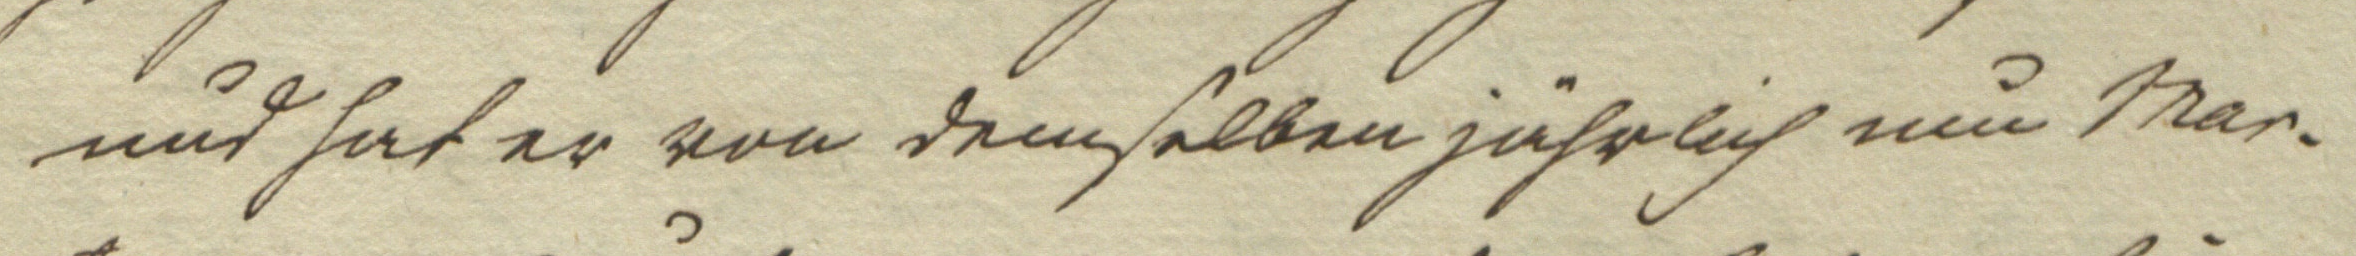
und hat er von demselben jährlich um Mar¬
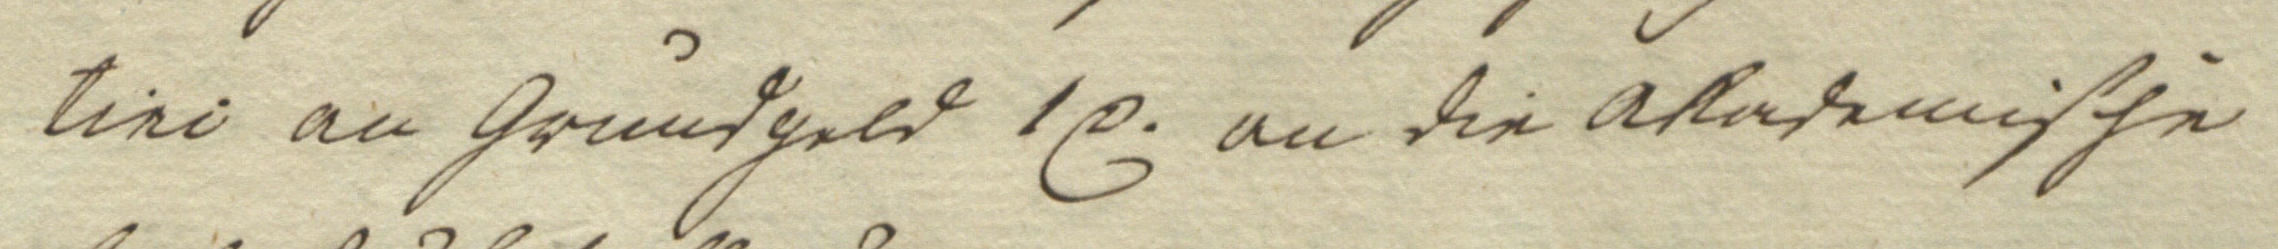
lini an Grundgeld 1l. an die akademische
